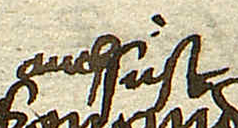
auch ſuſt
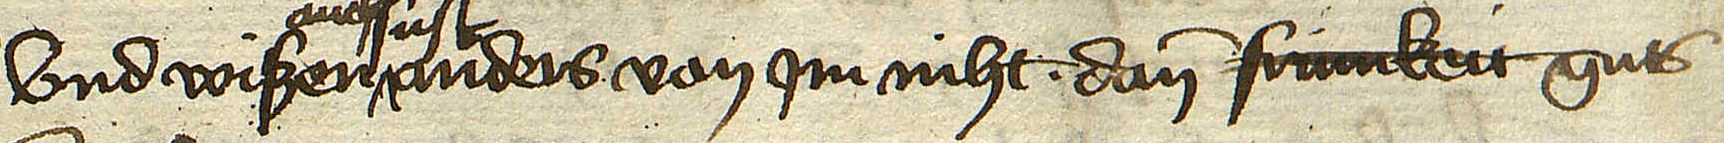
Vnd wiſ*en anders von Im niht . dan* frümkeit guts
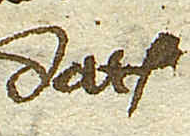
dat*
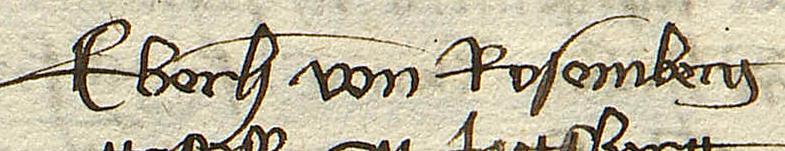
Eberh* von Roſemberg
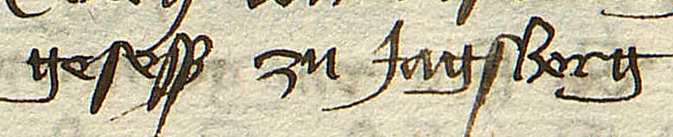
geſeſſ ʒu Iagſberg
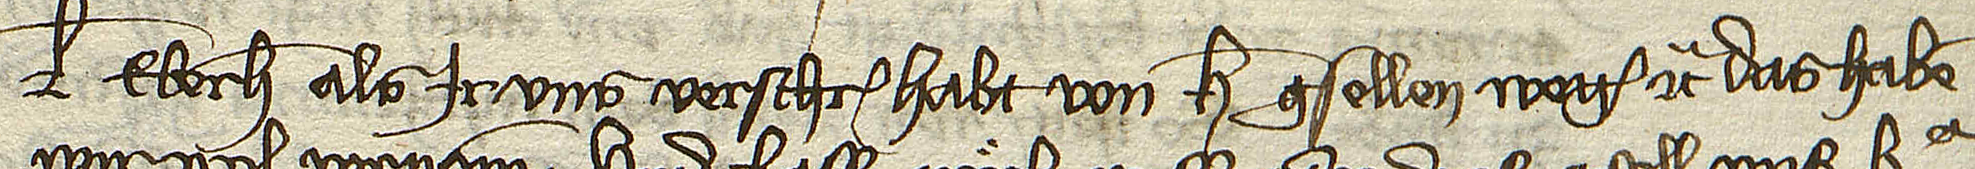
L* Eberh* als Ir vns verſchr* habt von h* gſellen weg* ec* das habe*
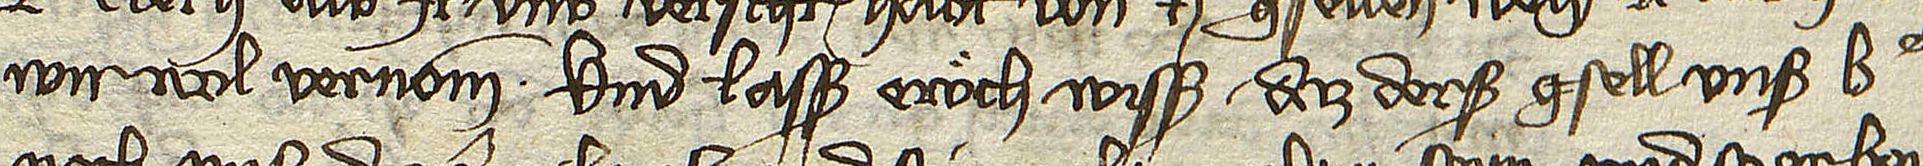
wir wol vernom* . Vnd laſſ* eẅch wiſſ* / daʒ derſ* gſell vns* b*
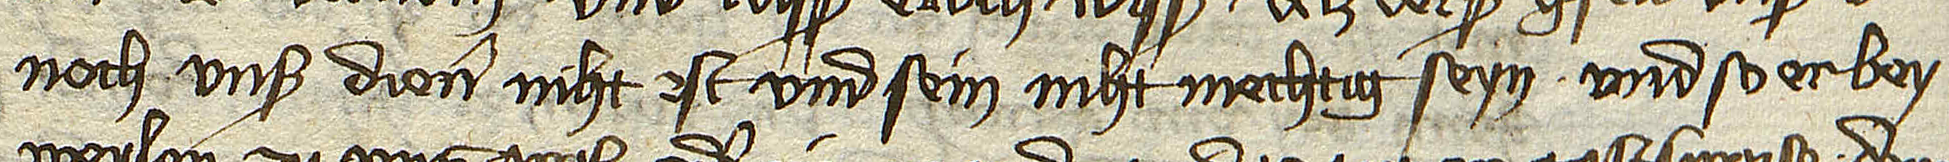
noch vnſ* dien* niht iſt vnd ſein niht mechtig ſeyn . vns ſo er bey
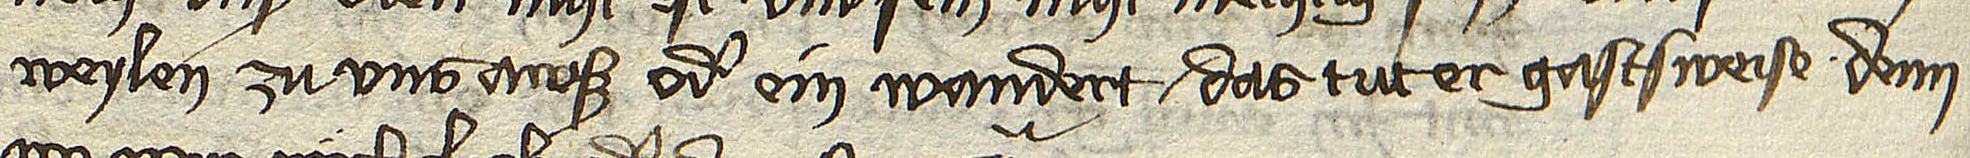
weylen ʒu vns awſ* od* ein wandert / das tut er gaſtſ weiſe . Denn
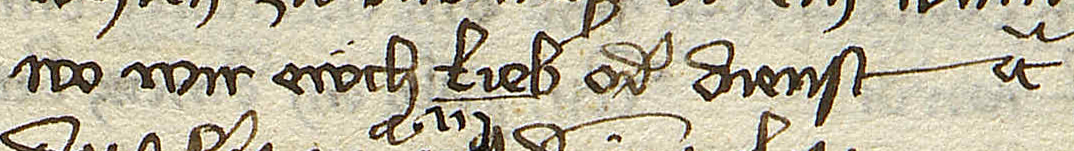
wo wir eẅch leib od* dienſt ec*
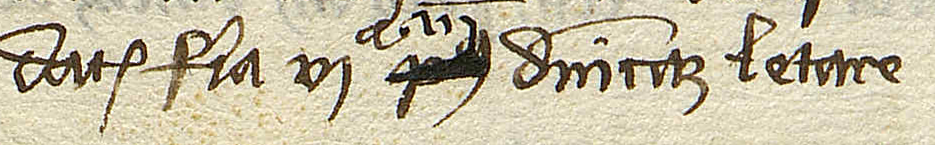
Dat* f*ia vi p* dnica* letare
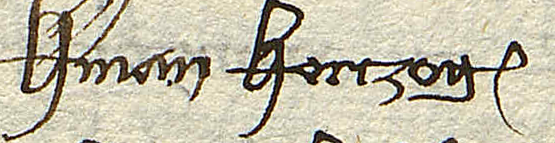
H*man Hercʒog*
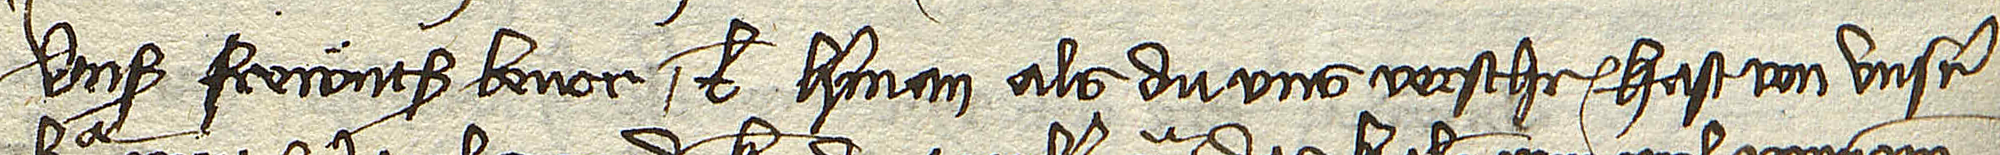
Vnſ* freẅntſ* beuor / l* h*man als du vns verſchr* haſt von vnſ*r
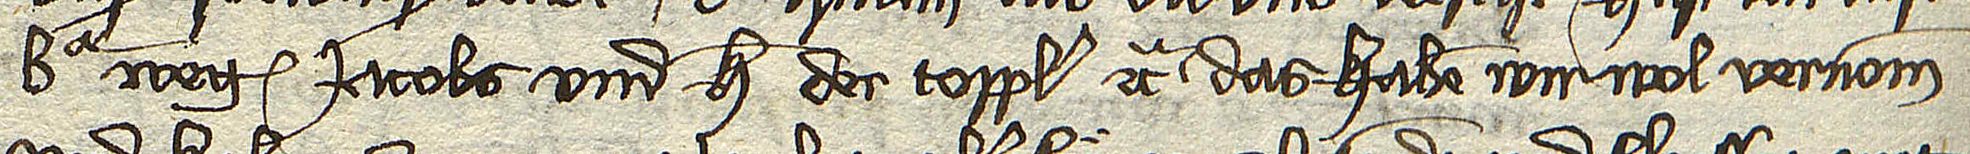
B* weg* Iacobs vnd h* der toppl* ec* / das habe* wir wol vernom*
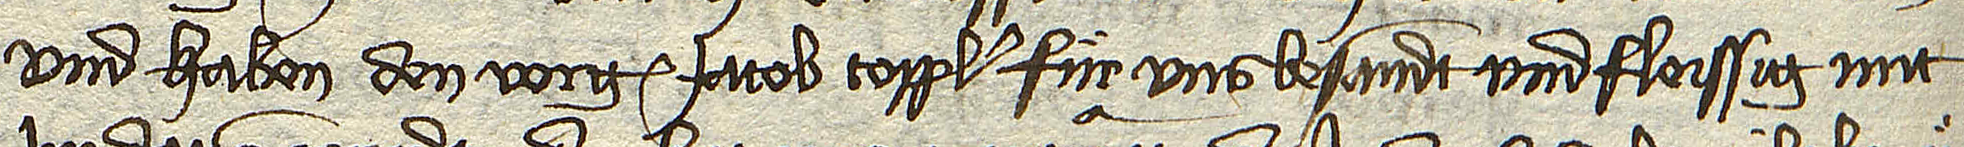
vnd haben den vorg* Iacob toppl* für vns beſandt vnd fleiſſig mit
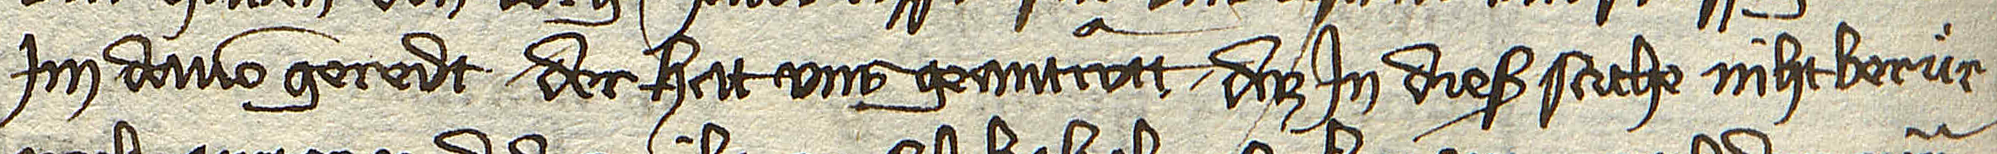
Im dauo* geredt / Der hat vns geantw*tt / daʒ In dieſ* ſache niht berür
